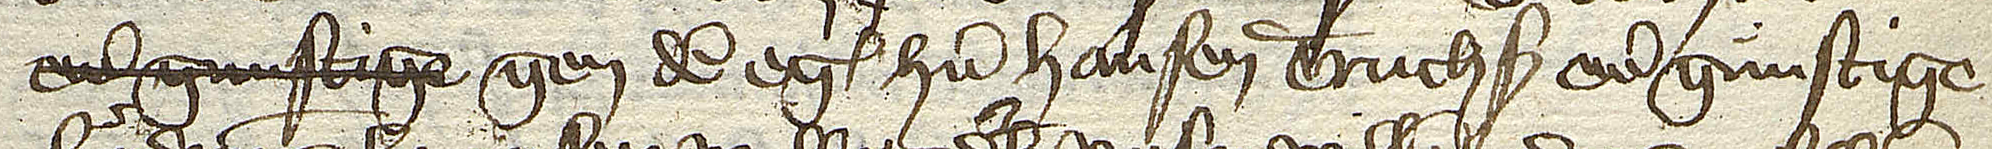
ew* gunſtige gen de* eg* hn* hanſen Truchſ* ew* günſtige
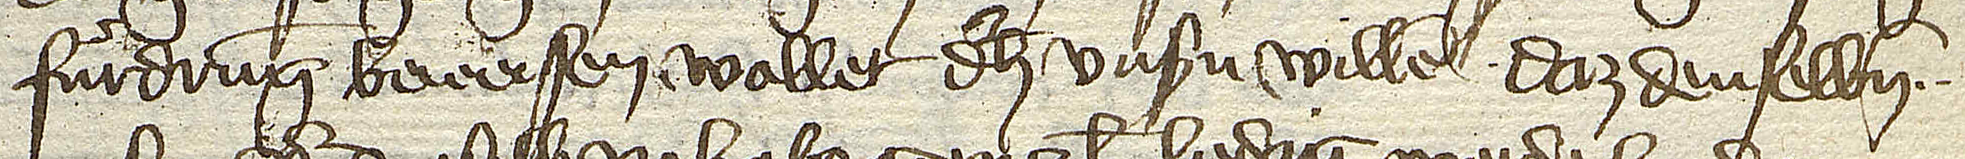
fürdrug* beweiſen wollet d*h vnſ*n wille* . daʒ denelbn* .
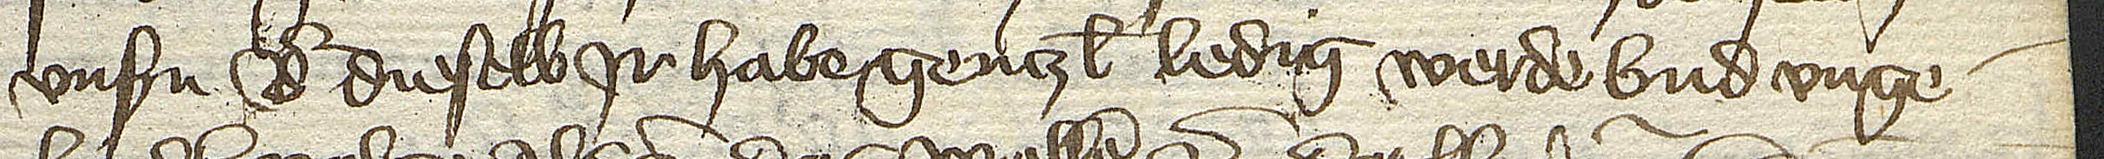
vnſ*n B* dieſelb Ir habe gencʒl* ledig werde vnd vnge -
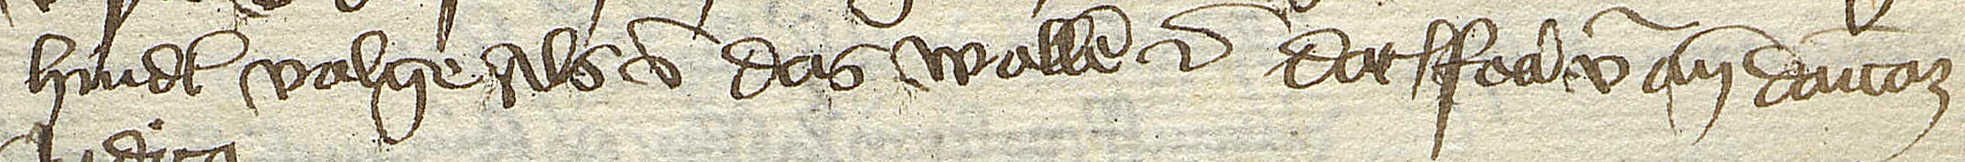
hindt* volge Als ec* das wolle* ec* Dat* fea* v* an* doica*
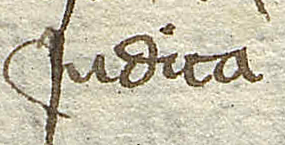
Iudica
